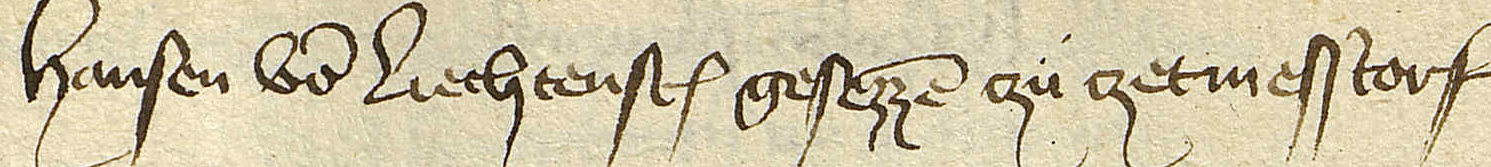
Hanſen vo* Liechtenſt* geſeʒʒe* cʒü cʒetmeſſtorf
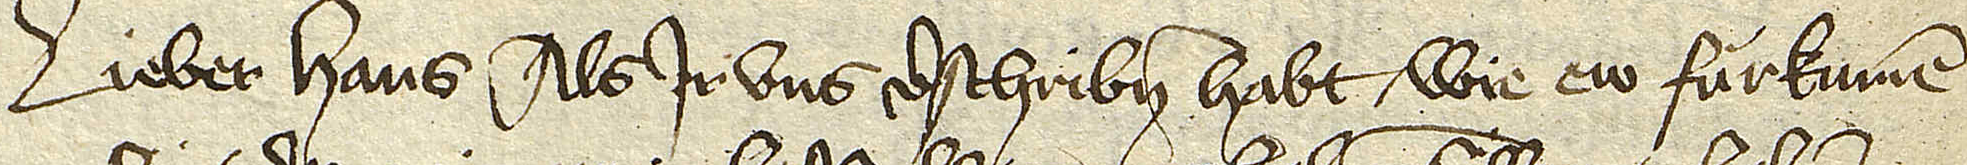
Lieber Hans / Als Ir vns v*ſchribn* habt / wie ew fürkume*
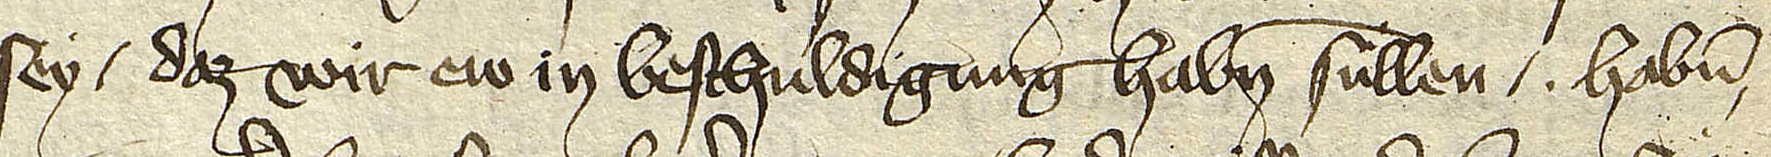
ſey / daʒ wir ew in beſchuldigung habn* ſüllen / . habn*
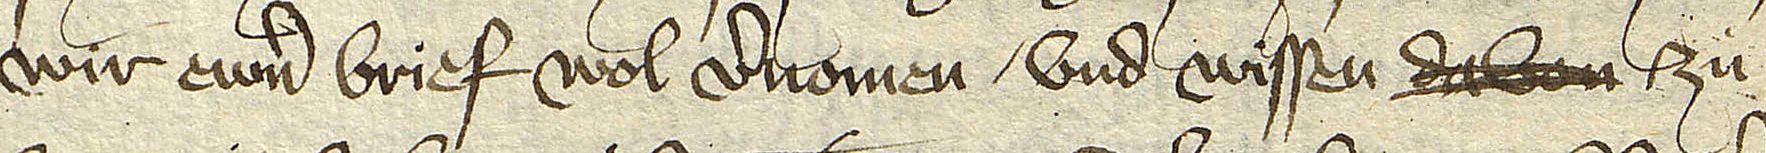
wir ewn* brief wol v*nomen / vnd wiſſen davon cʒü
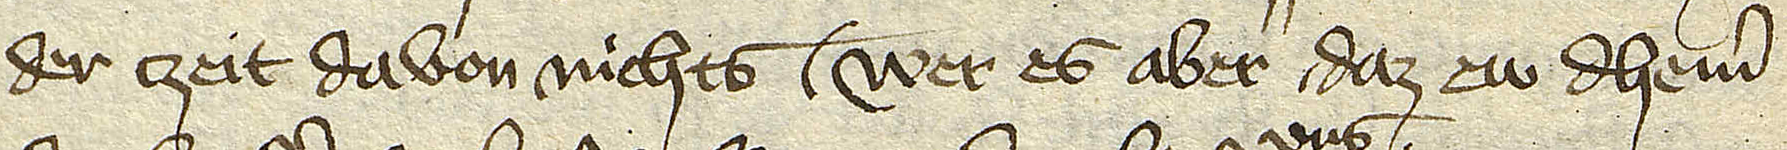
der cʒeit davon nichts / wer es aber / daʒ ew dhein*
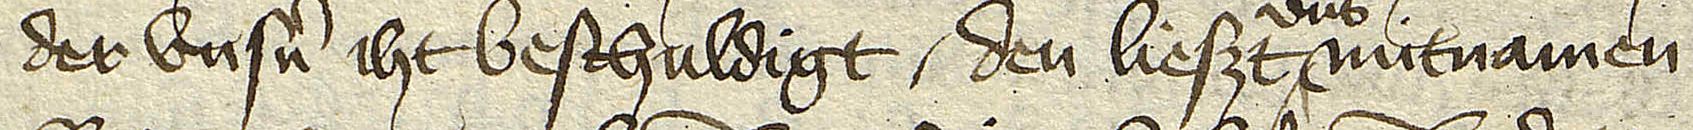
der vnſn* iht beſchuldigt / den lieſʒt mitnamen
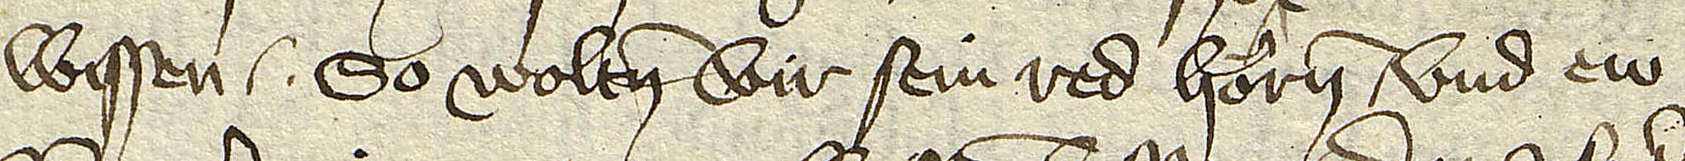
wiſſen / . So woltn* wir ſein red hörn* / vnd ew
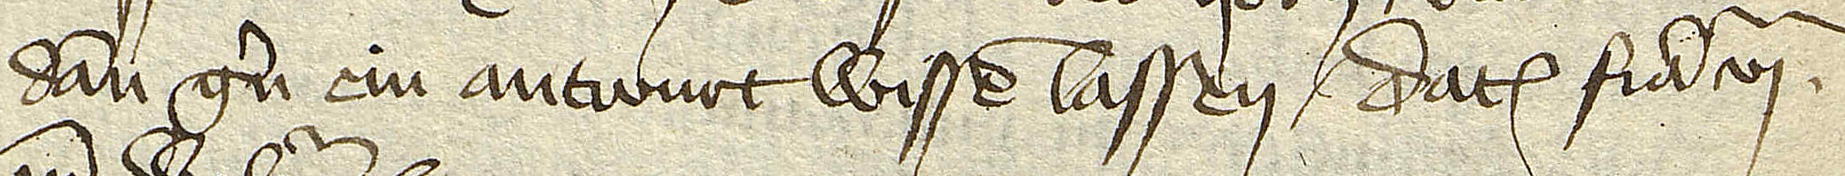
dan* g*n ein antwurt wiſſe* laſſen / Dat* fia* vi*.
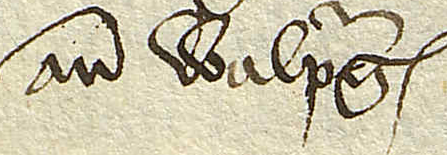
an* Walp*g*
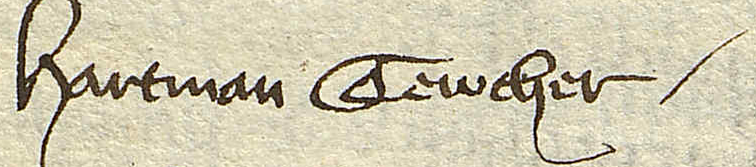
Hartman Tewcher /
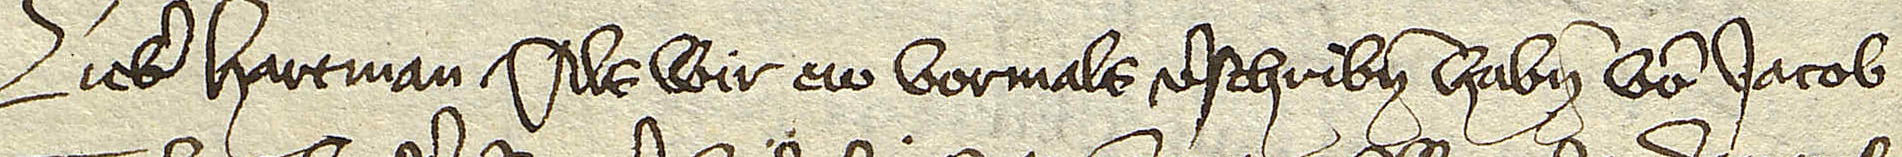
Lieb* Hartman / Als wir ew vormals v*ſchribn* habn* vo* Iacob
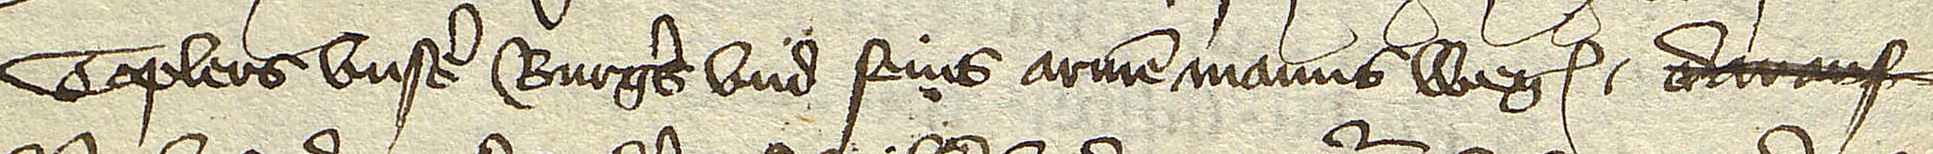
Toplers vnſs* Burg*s vnd ſeins arme* manns weg* / darauf
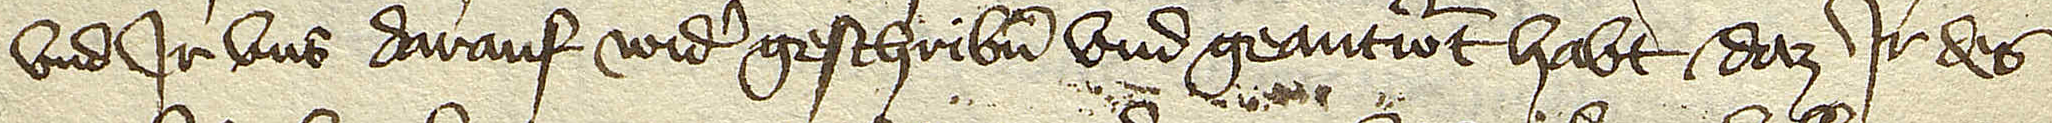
vnd Ir vns darauf wid* geſchribn* vnd geantwt* habt / daʒ Ir des
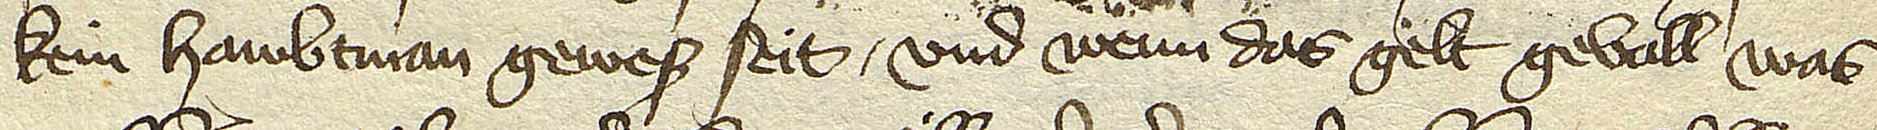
kein hawbtman geweſ* ſeit / vnd wenn das gelt gevall was
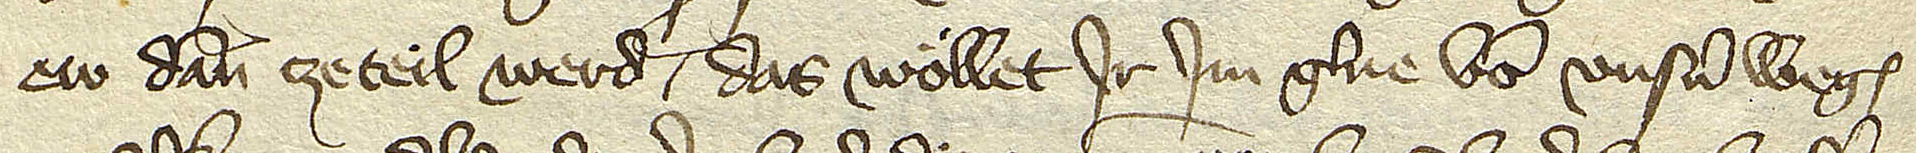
ew dan* cʒeteil werd / das wöllet Ir Im g*ne vo* vnſn* weg*
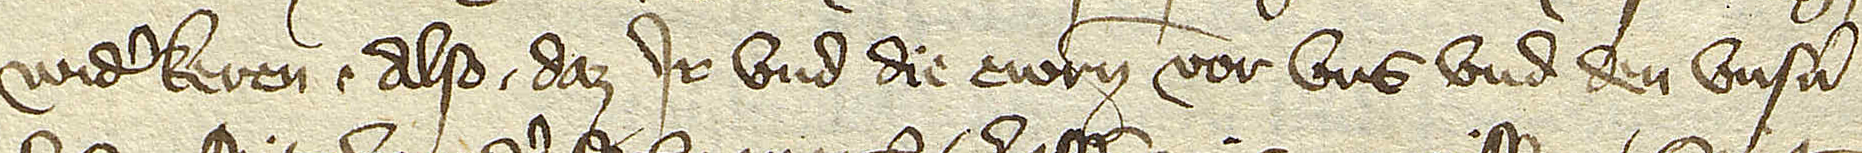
wid* keren / Alſo / daʒ Ir vnd die ewrn* vor vns vnd den vnſn*
